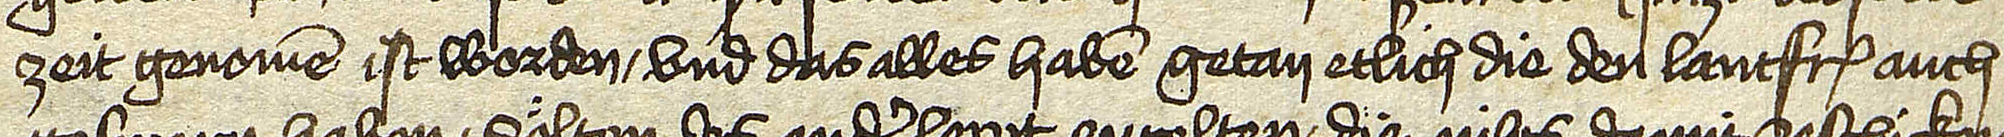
cʒeit genome* iſt worden / vnd das alles habe* getan etlich die den lantfr* auch
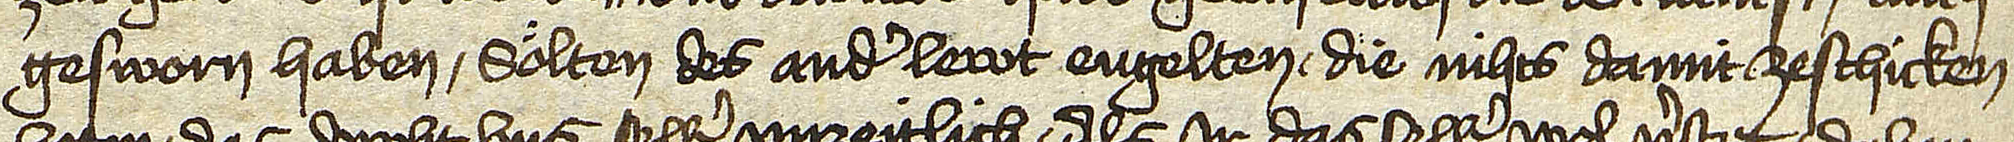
geſworn haben / Sölten des and* lewt engelten / die nihts damit cʒeſchicken
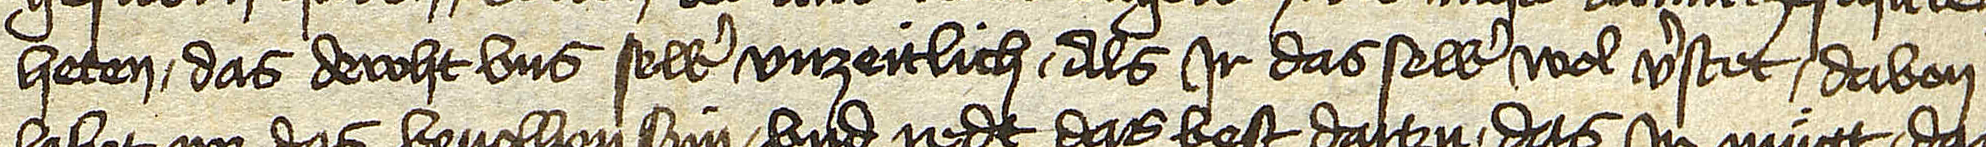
heten / das dewht vns ſelb* vnʒeitlich / Als Ir das ſelb* wol v*ſtet / davon
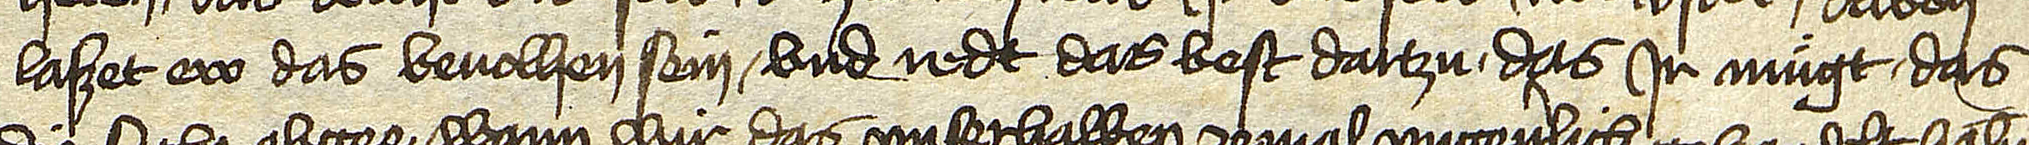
laſʒet ew das beuolhen ſein / vnd redt das beſt dartʒu / das Ir mügt / das
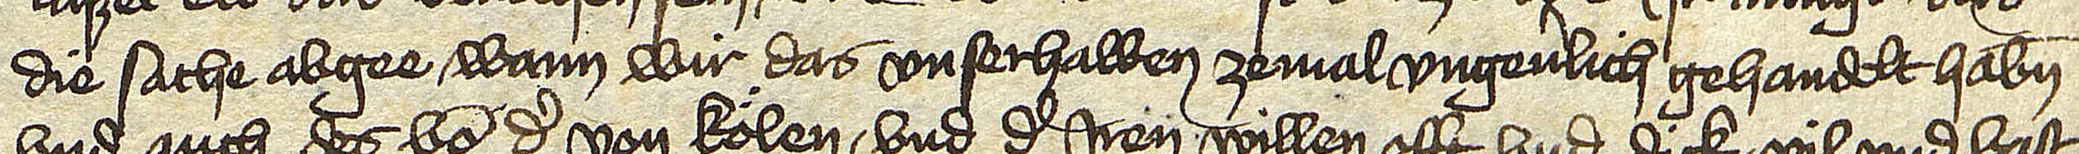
die ſache abgee / wann wir das vnſerhalben cʒemal vngeu*lich gehandelt habn*
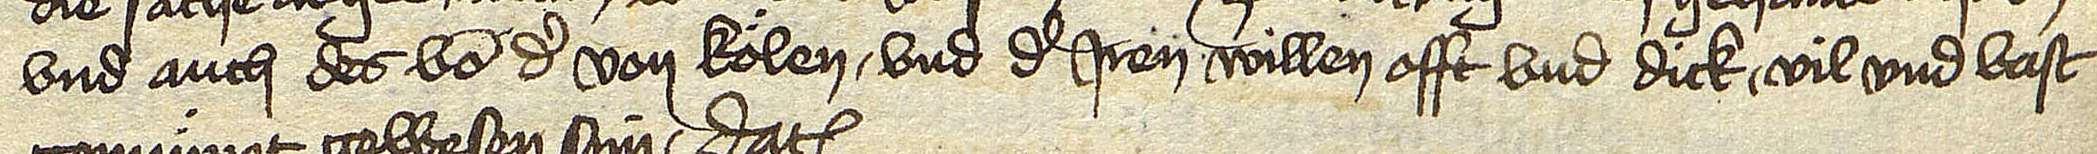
vnd auch des vo* d* von Kölen / vnd d* Iren willen offt vnd dick / vil vnd vaſt
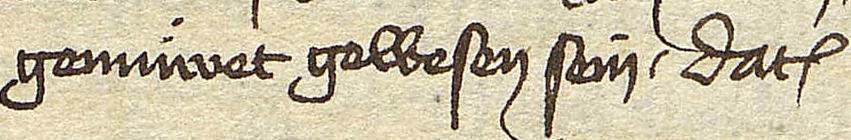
gemüwet geweſen ſein / dat*
